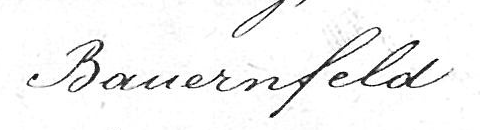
Bauernfeld
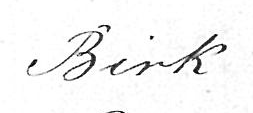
Birk
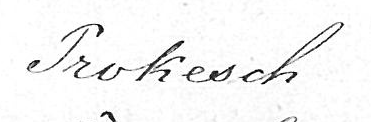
Prokesch
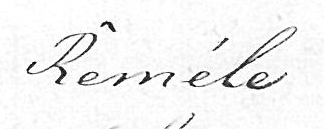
Reméle
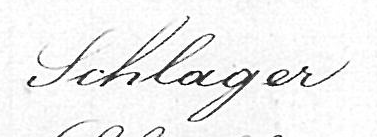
Schlager
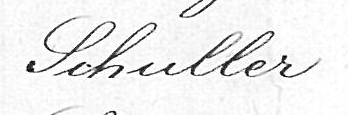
Schuller
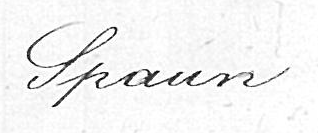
Spaun
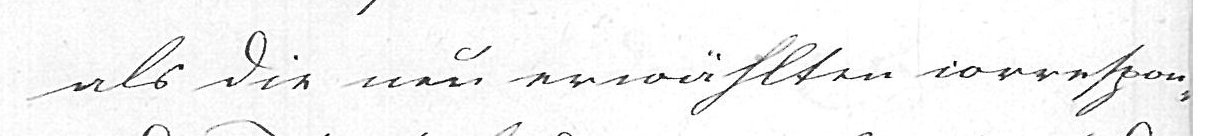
als die neu erwählten correspon-
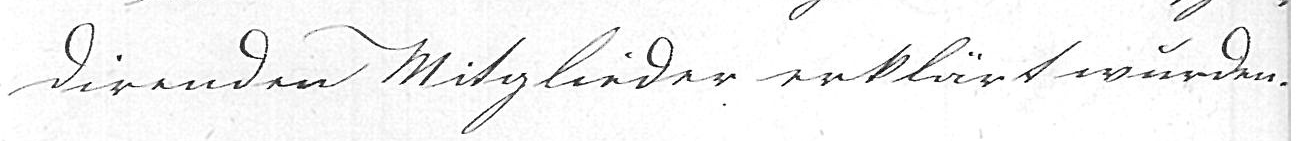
direnden Mitglieder erklärt wurden.
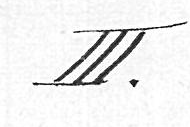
III.
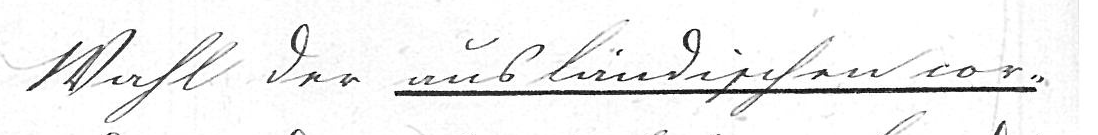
Wahl der ausländischen cor-
